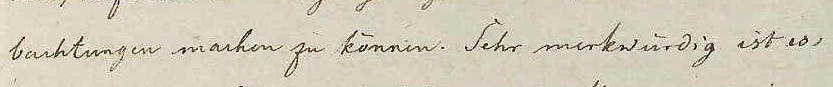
bachtungen machen zu können. Sehr merkwürdig ist es,
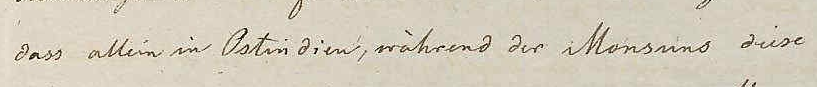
dass allein in Ostindien, während der Monsuns diese
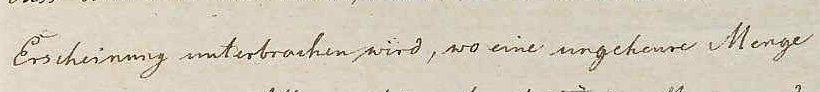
Erscheinung unterbrochen wird, wo eine ungeheure Menge
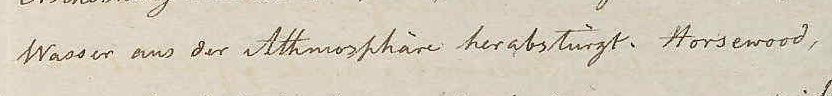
Wasser aus der Athmosphäre herabstürzt. Horsewood,
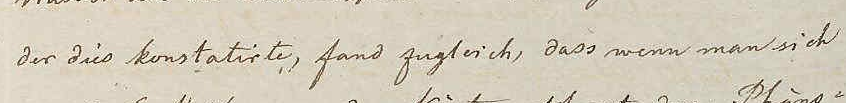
der dies konstatirte, fand zugleich, dass wenn man sich
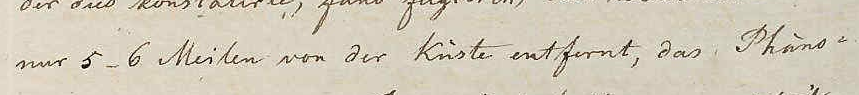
nur 5–6 Meilen von der Küste entfernt, das Phäno-
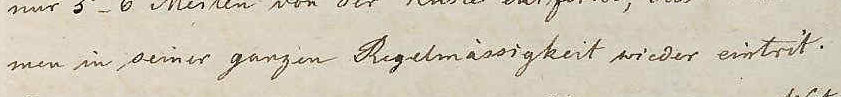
men in seiner ganzen Regelmässigkeit wieder eintrit.
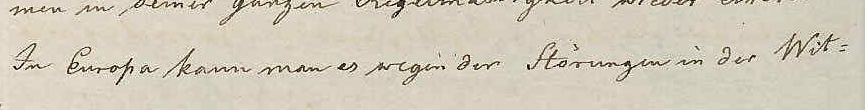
In Europa kann man es wegen der Störungen in der Wit-
